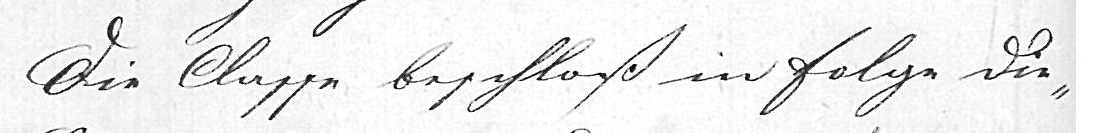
Die Classe beschloß in Folge die-
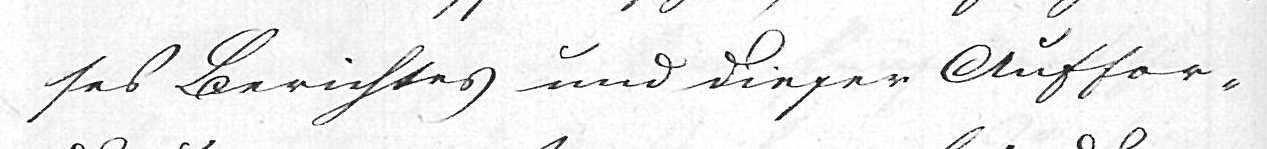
ses Berichtes und dieser Auffor-
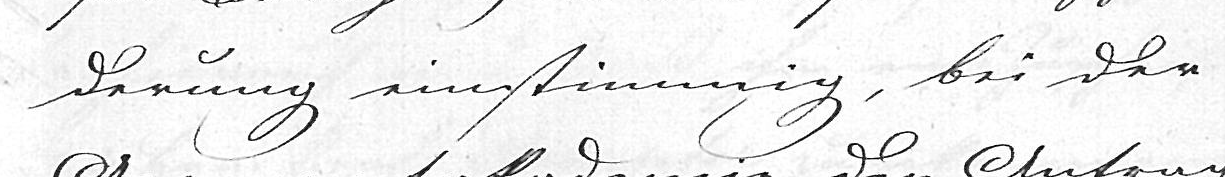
derung einstimmig bei der
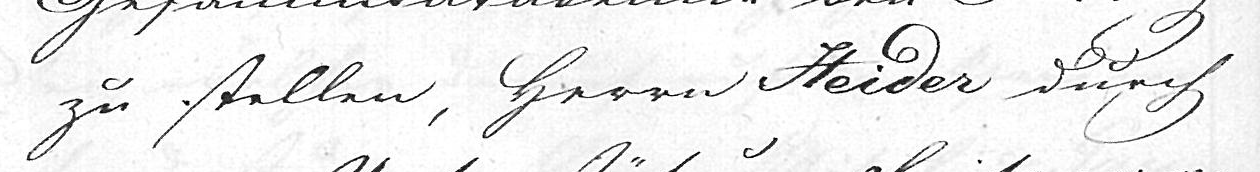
zu stellen, Herrn Heider durch
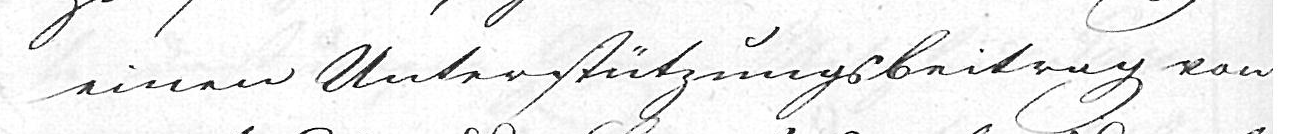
einen Unterstützungsbeitrag von
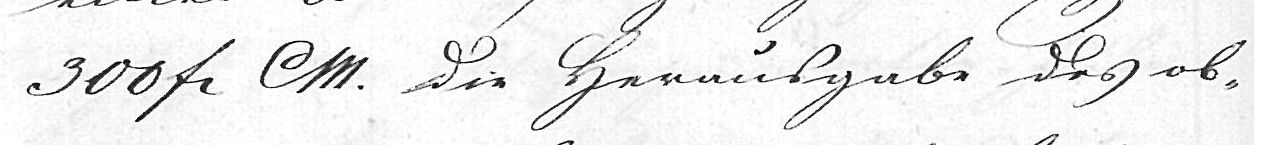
300 fr. CM. die Herausgabe des ob-
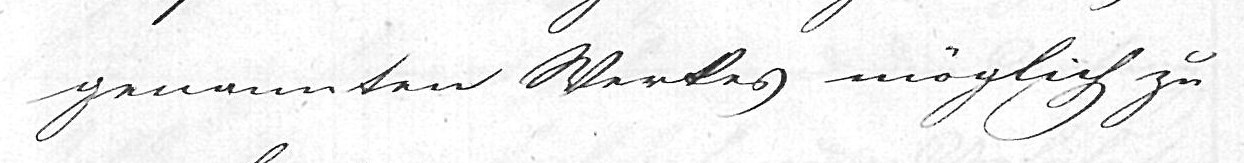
genannten Werkes möglich zu
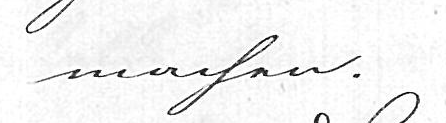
machen.
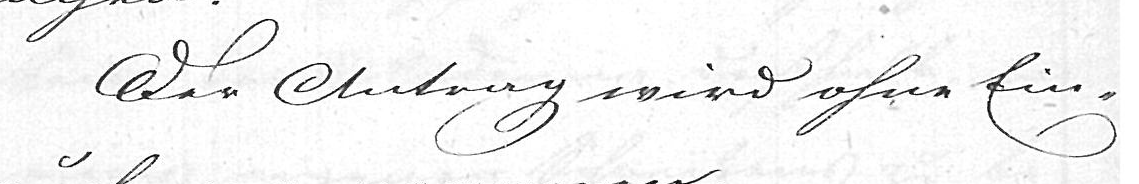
Der Antrag wird ohne Ein-
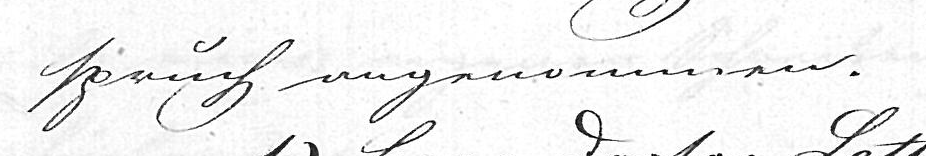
spruch angenommen.
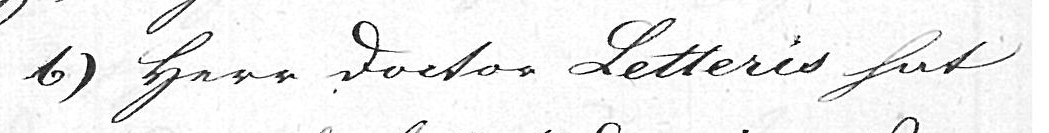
b) Herr Doctor Letteris hat
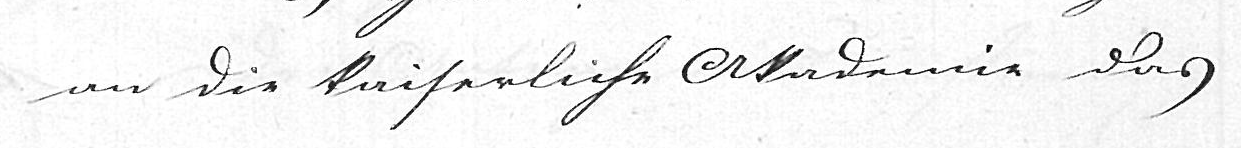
an die kaiserliche Akademie das
